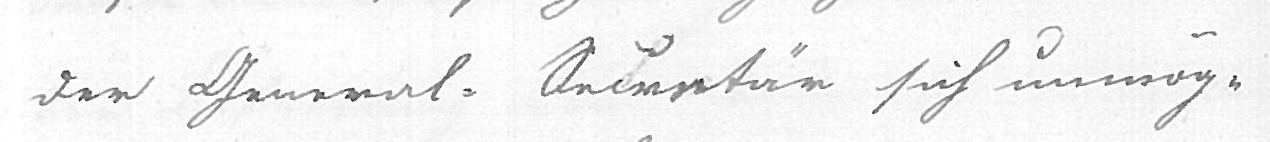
der General-Secretär sich umög-
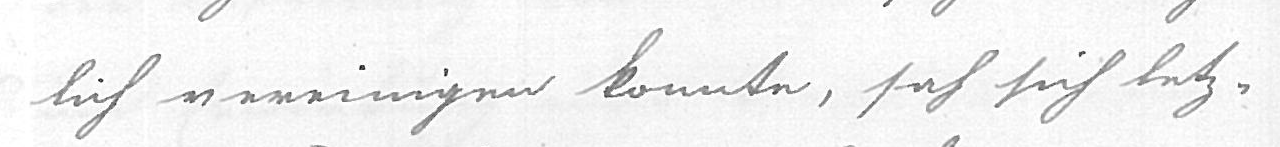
lich vereinigen konnte, sah sich letz-
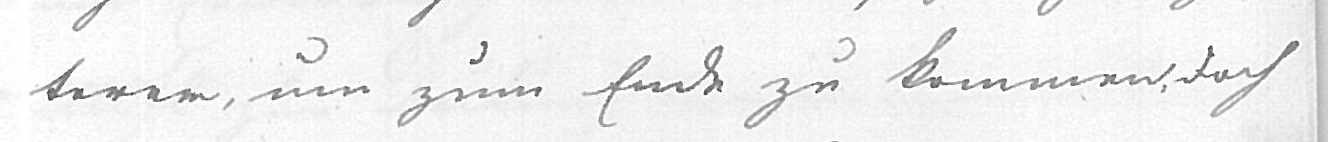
terer, um zum Ende zu kommen, doch
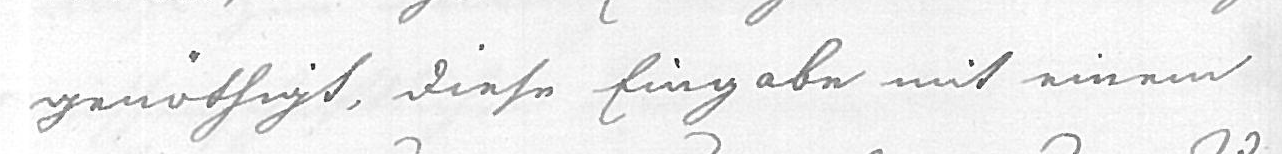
genöthigt, diese Eingabe mit einem
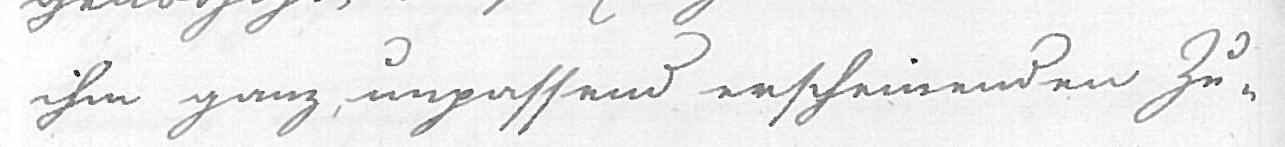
ihm ganz unpassend erscheinenden Zu-
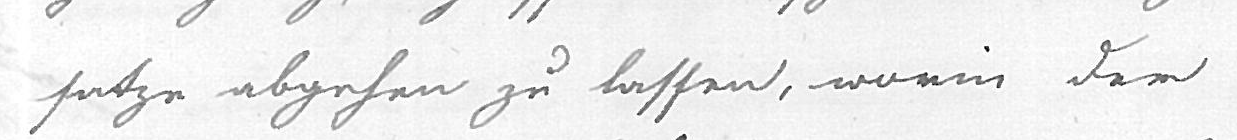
satze abgehen zu lassen, worin der
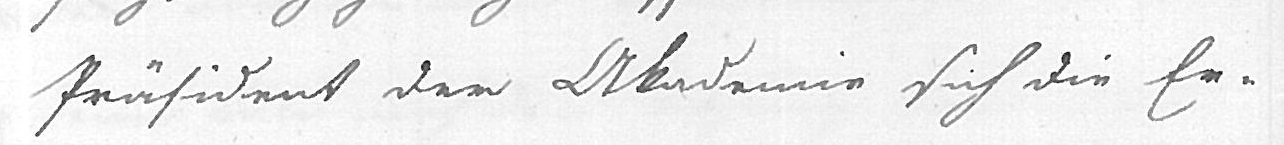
Präsident der Akademie sich die Er-
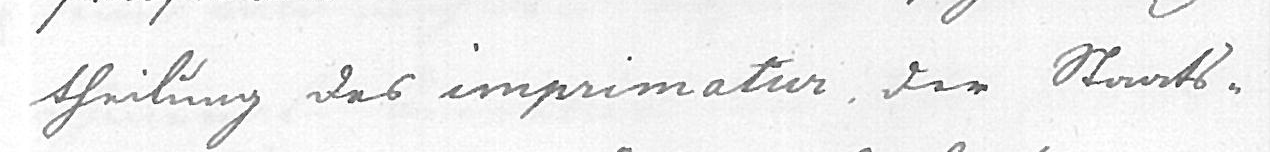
theilung des imprimatur der Staats-
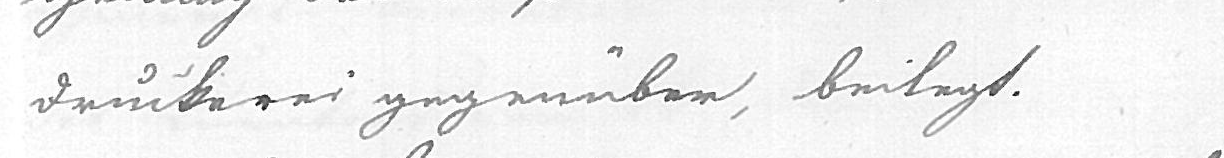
druckerei gegenüber beilegt
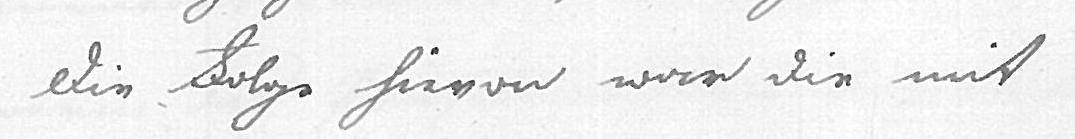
Die Folge hievor war die mit
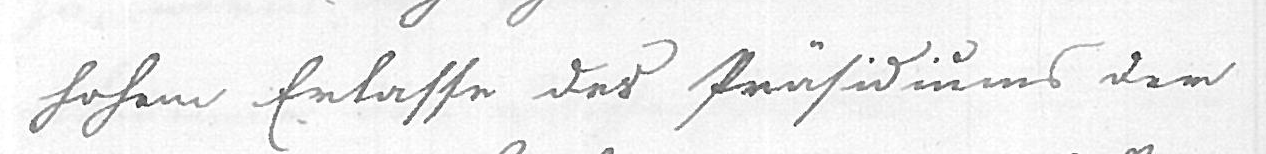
hohem Erlasse des Präsidiums der
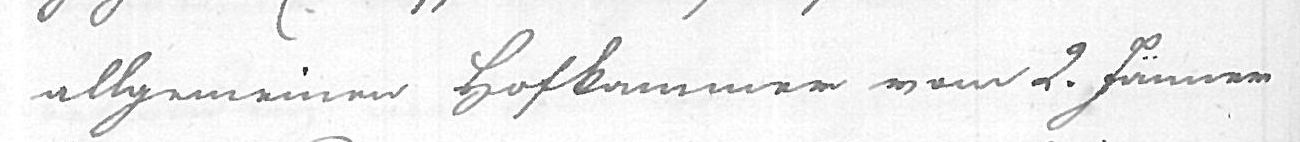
allgemeinen Hofkammer vom 2. Jänner
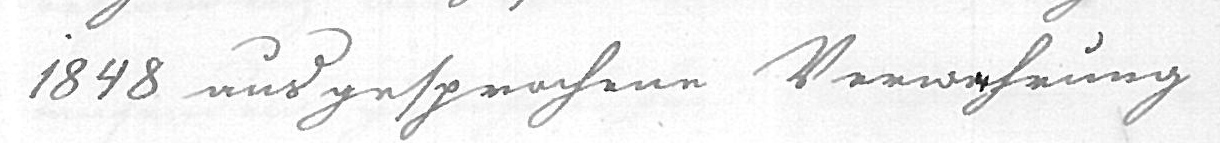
1848 ausgesprochene Verwahrung
